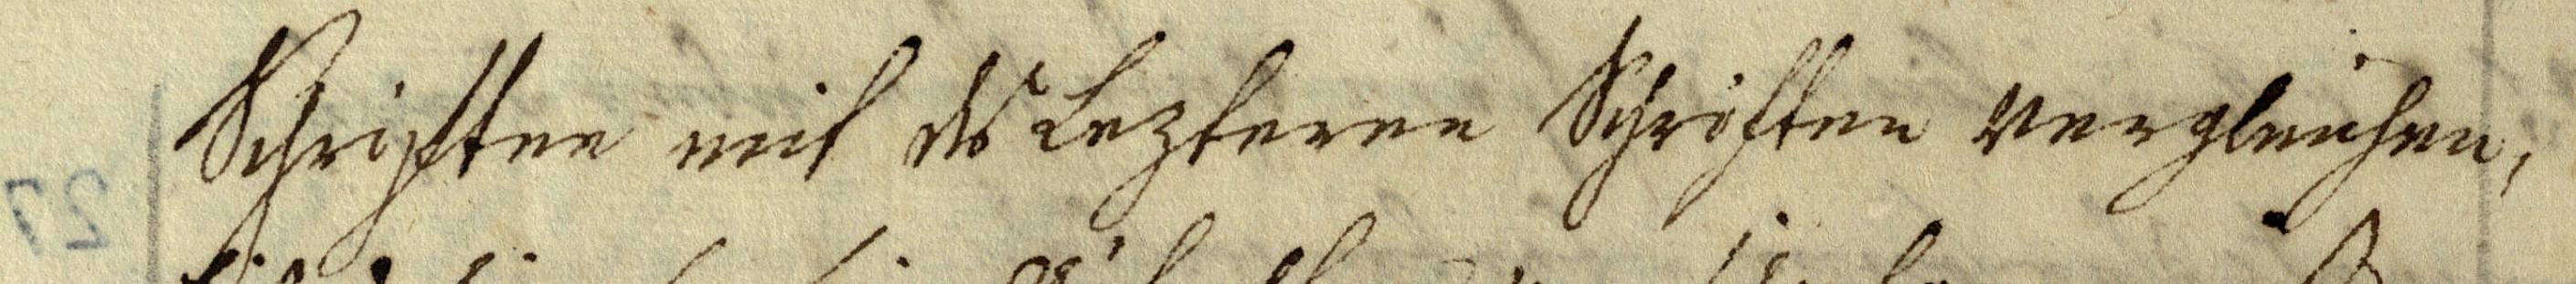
Schriften mit des Lezteren Schriften vergleichen,
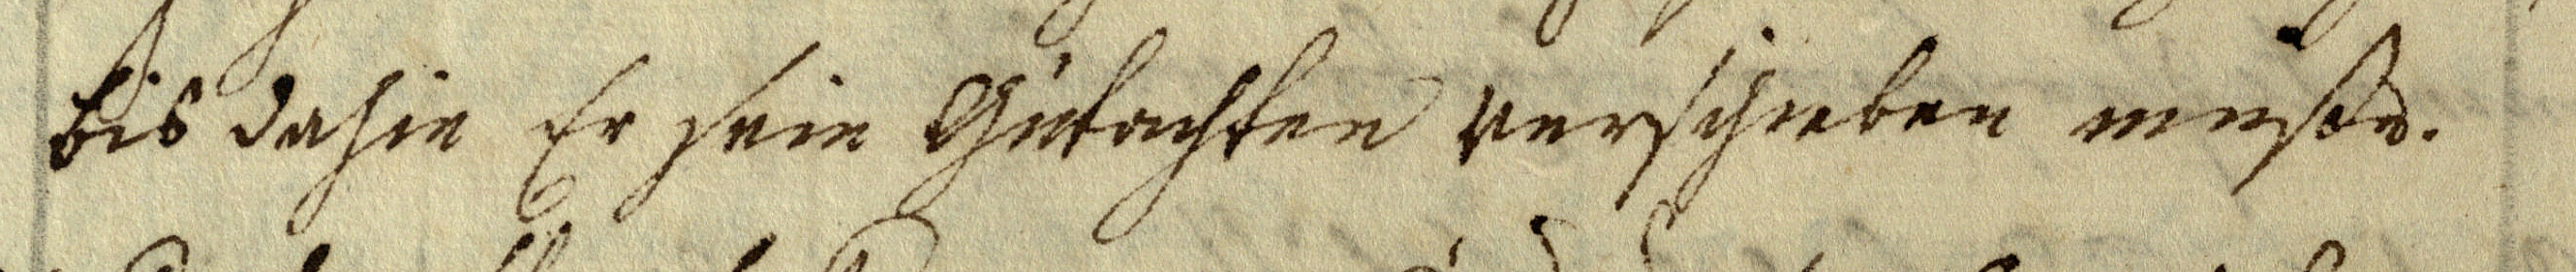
bis dahin Er sein Gutachten verschieben müße.
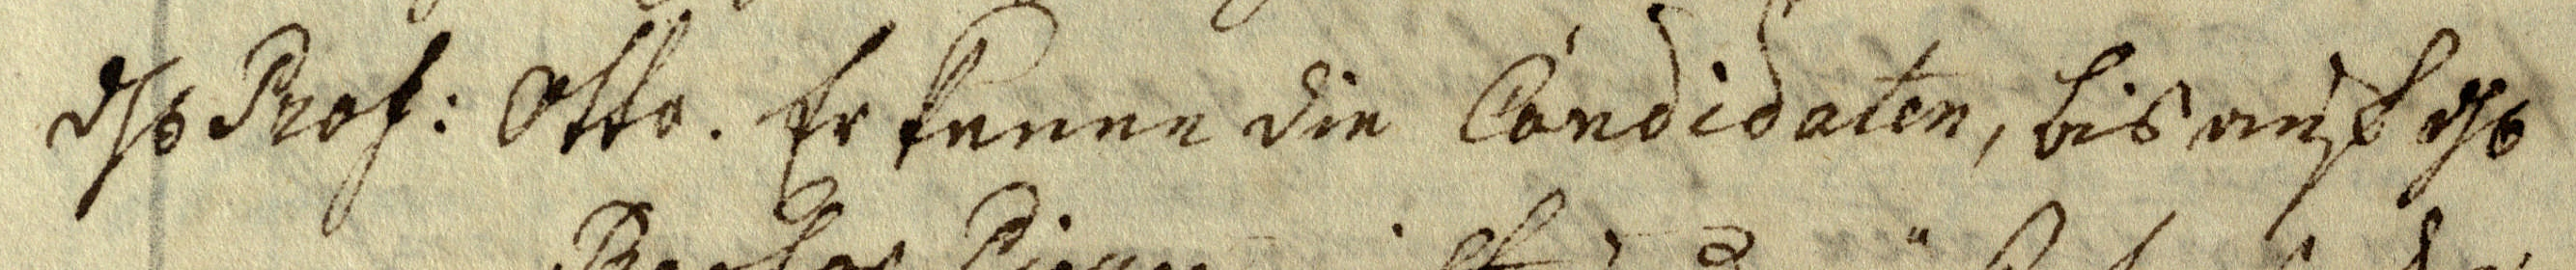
dh. Prof. Otto. Er kenne die Candidaten, bis auf dh
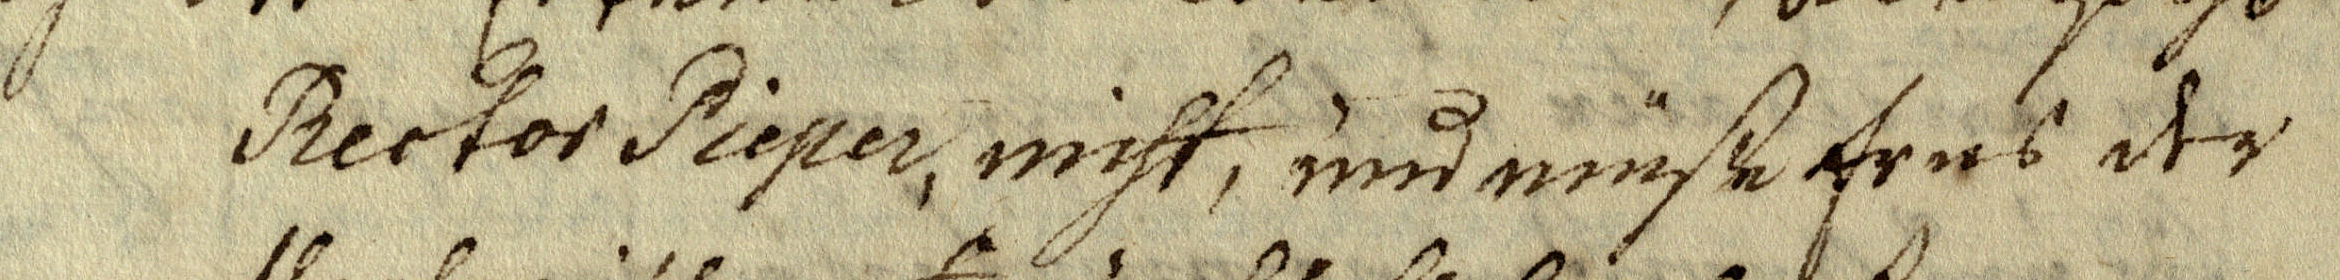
Rector Pieper, nicht, und müße Er es der
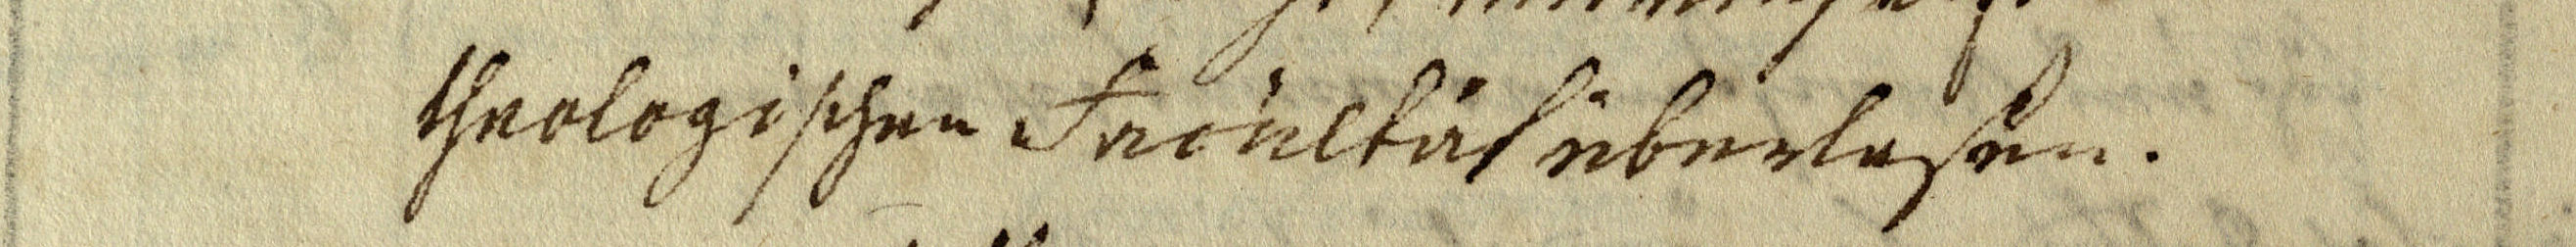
theologischen Facultät überlaßen.
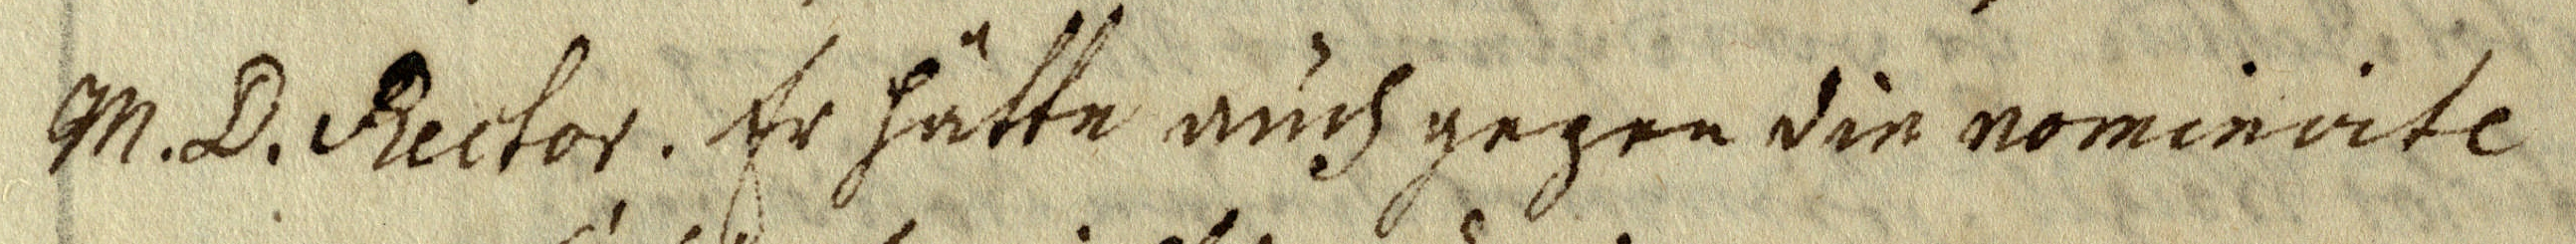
M. D. Rector. Er hätte auch gegen die nominirte
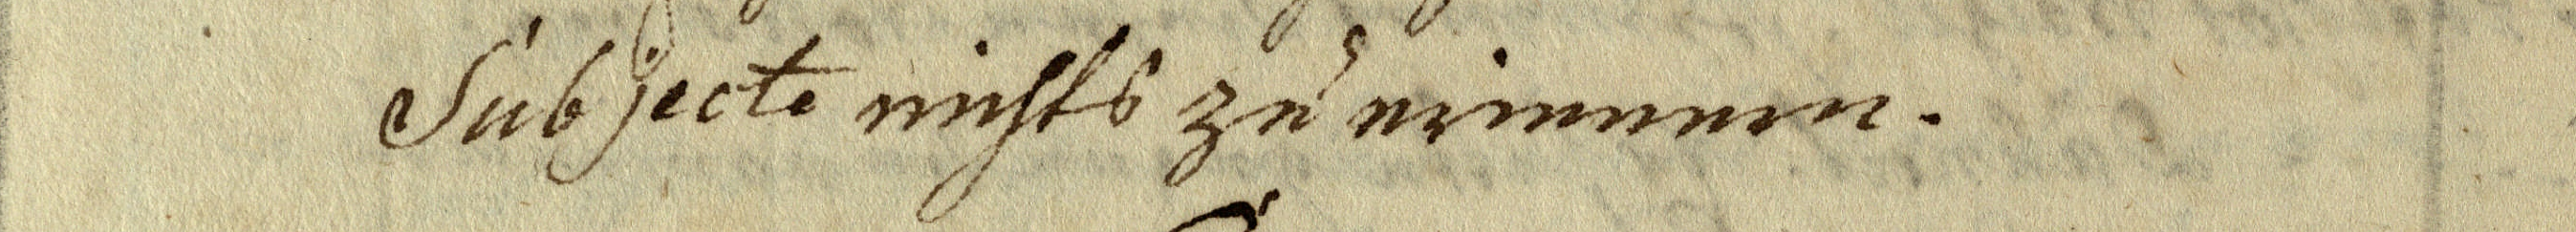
Subjecte nichts zu erinnern.
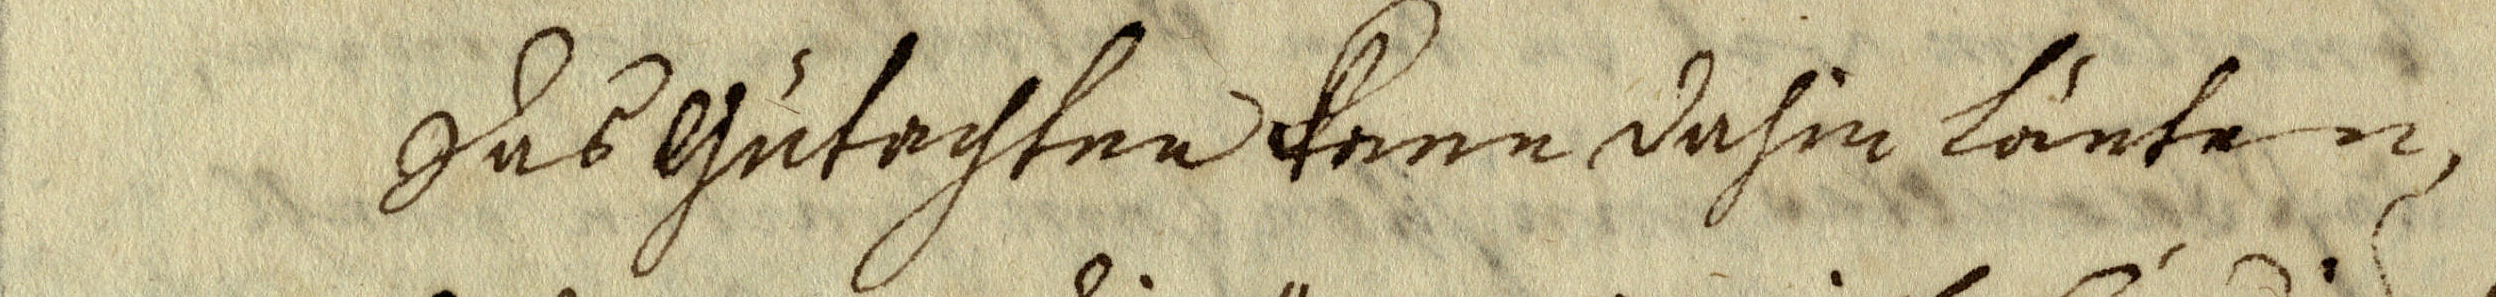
Das Gutachten kann dahin lauten,
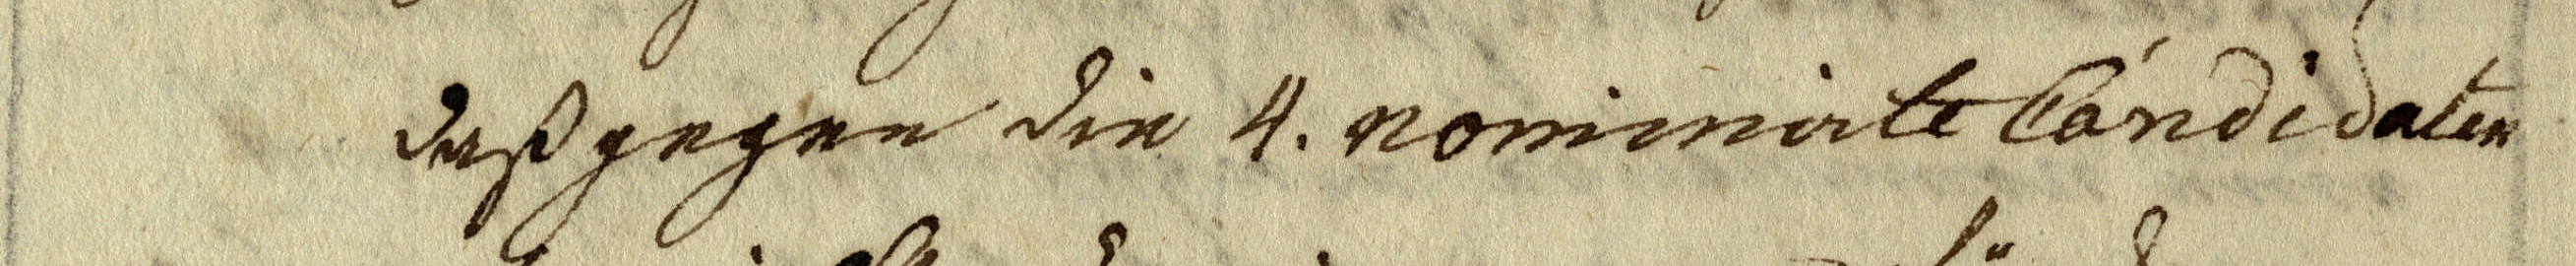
daß gegen die 4. nominirte Candidaten
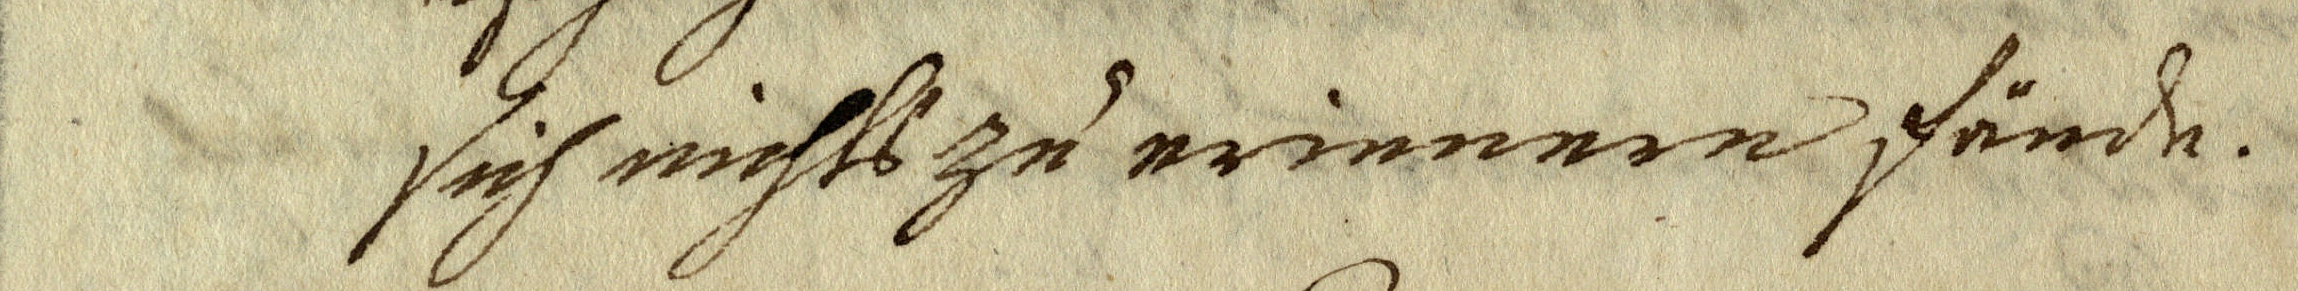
sich nichts zu erinnern fände.
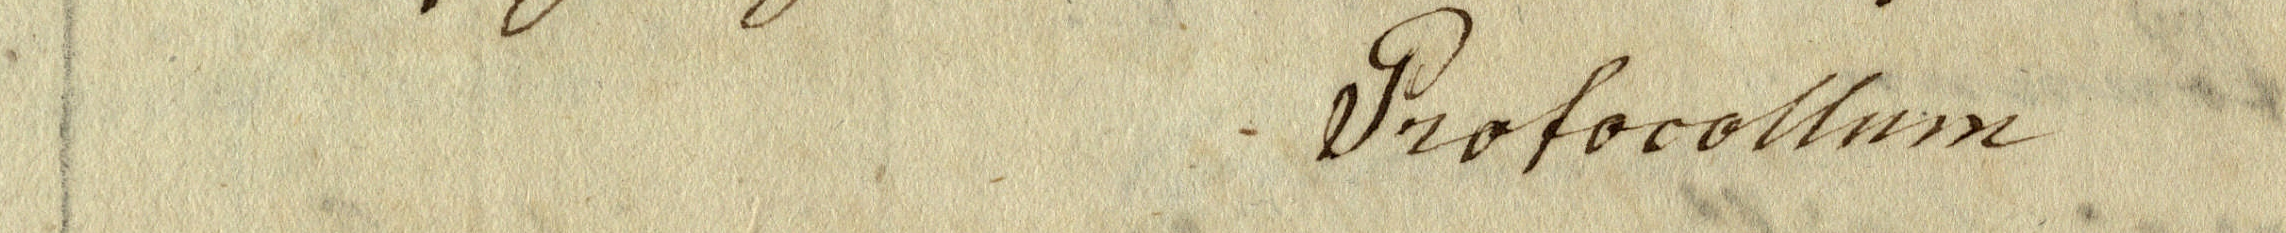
Protocollum
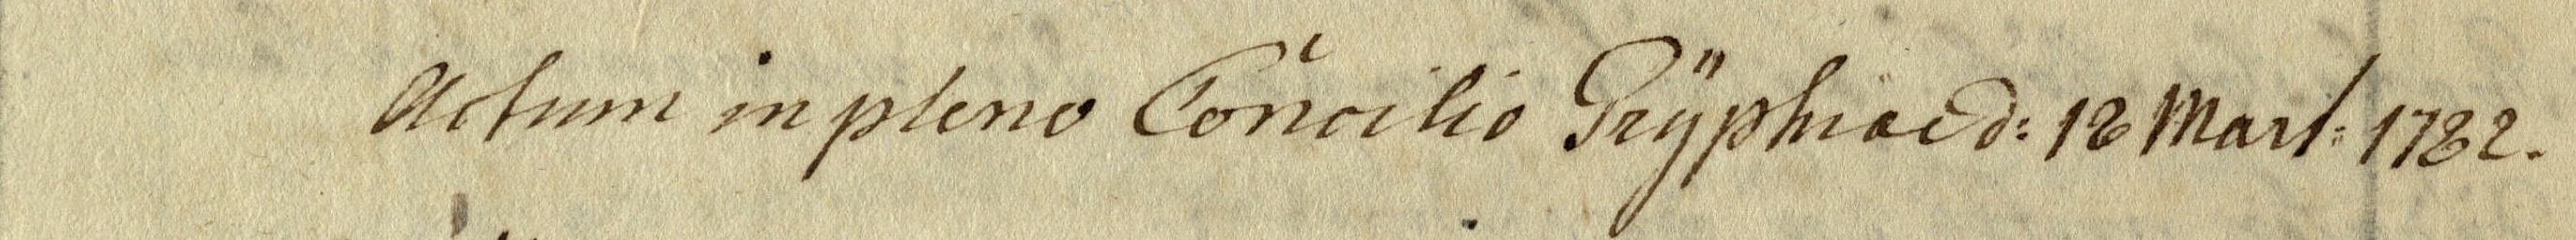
Actum in pleno Concilio Grÿphiae d. 18 Mart 1782.
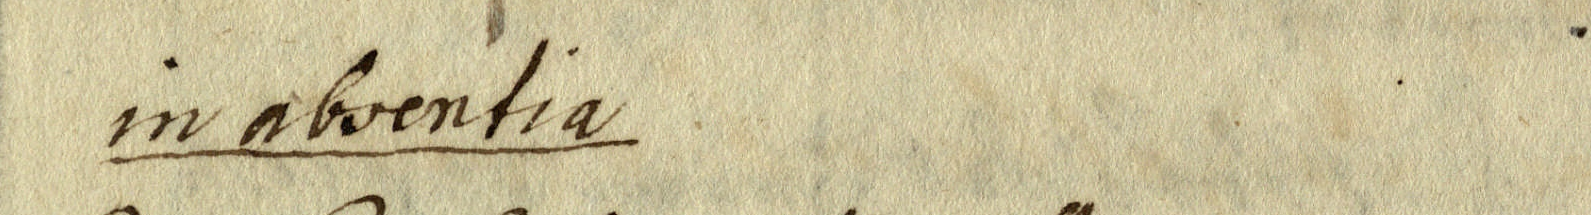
in absentia
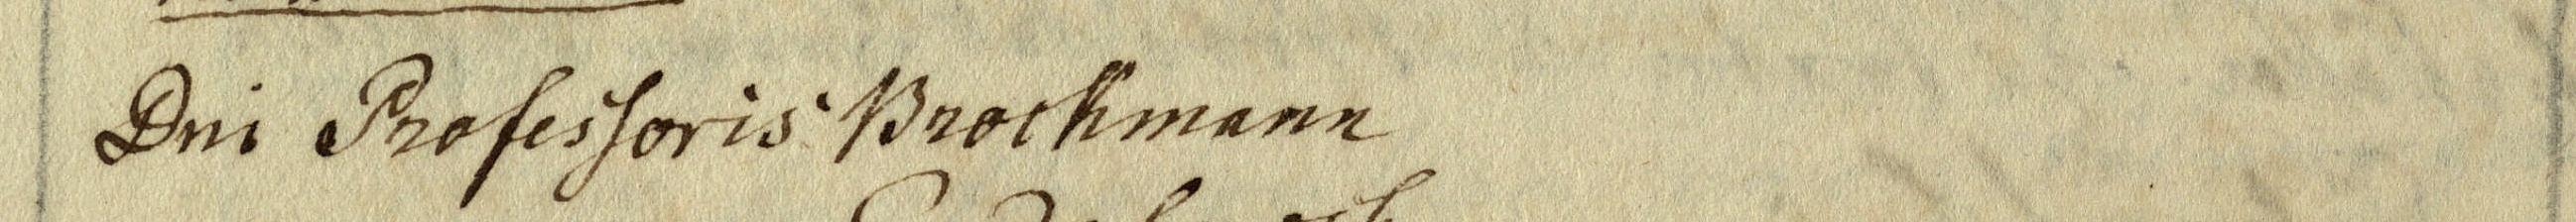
Dni Professoris Brockmann
